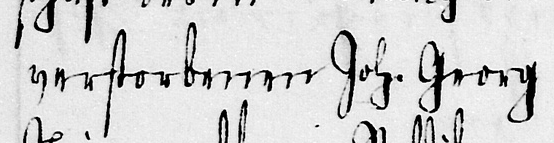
verstorbene Joh. Georg
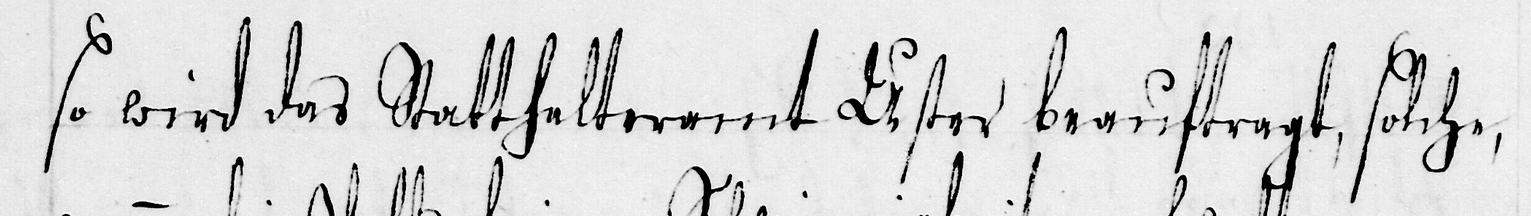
so wird das Statthalteramt Uster beauftragt, solch¬
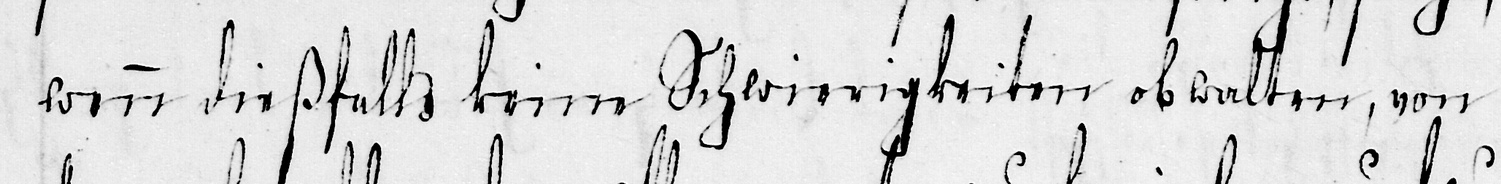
wenn dießfalls keine Schwierigkeiten obwalten, von
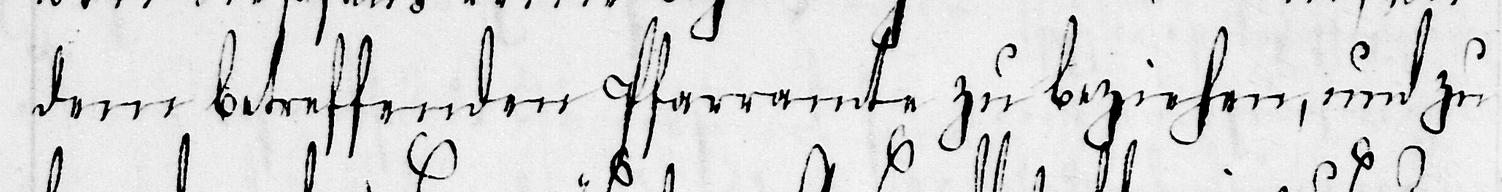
dem betreffenden Pfarramte zu beziehen, und zu
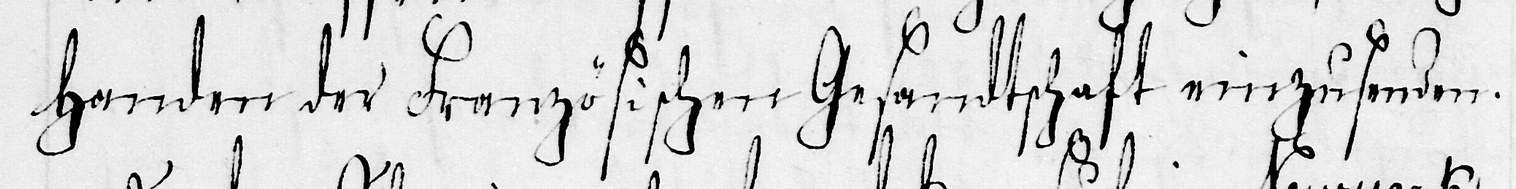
Handen der Französischen Gesandtschaft einzusenden.
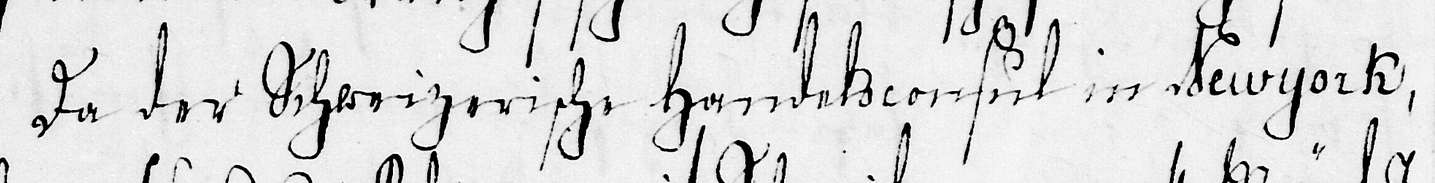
Da der Schweizerische Handelsconsul in Newyork,
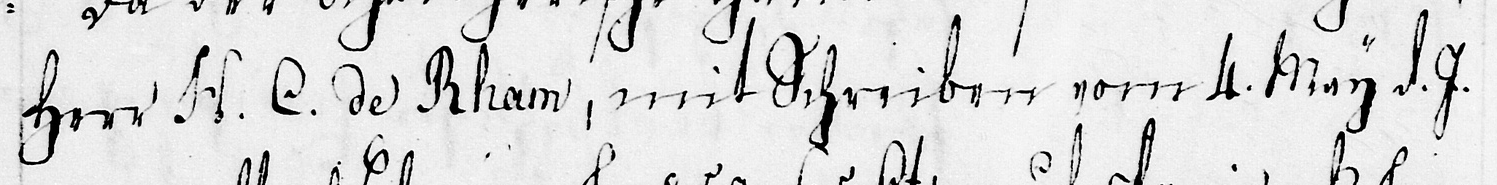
Herr H. C. de Rham, mit Schreiben vom 4. May d. J.
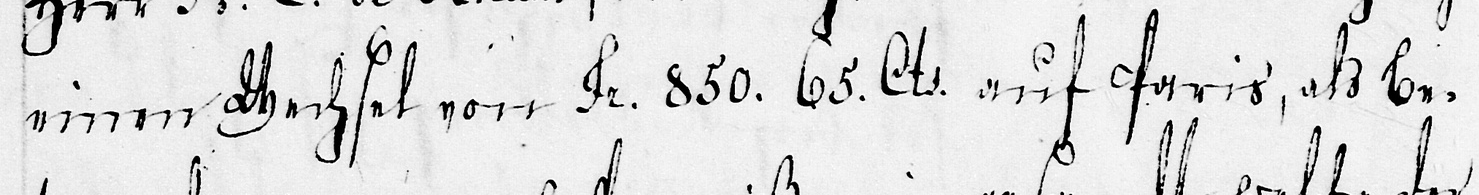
einen Wechsel von Fc. 850. 65. Cts. auf Paris, als Be¬
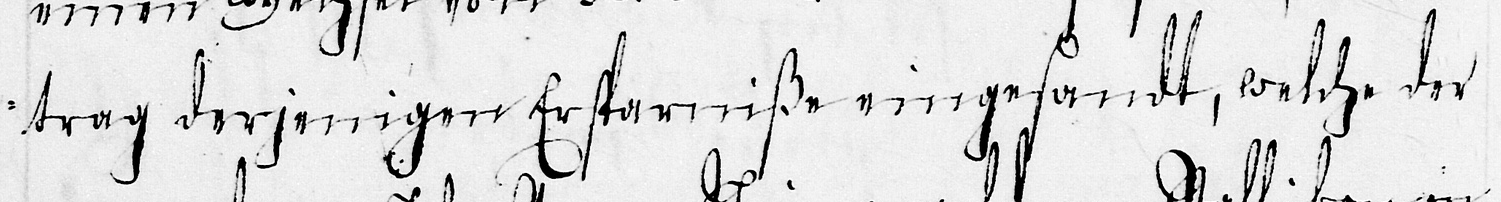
trag derjenigen Ersparniße eingesandt, welche der
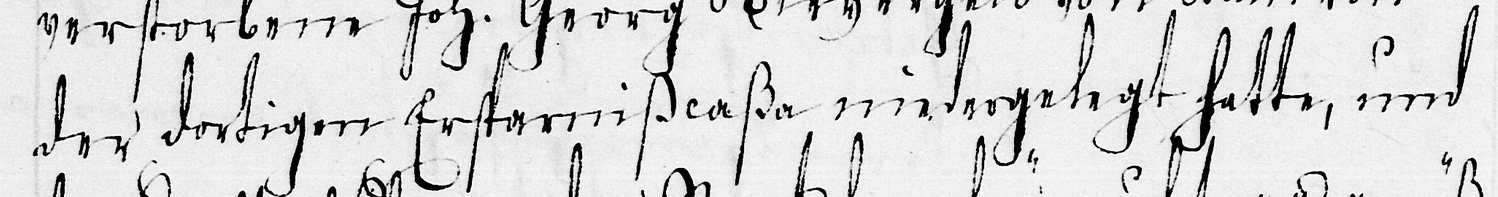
der dortigen Ersparnißcaßa niedergelegt hatte, und
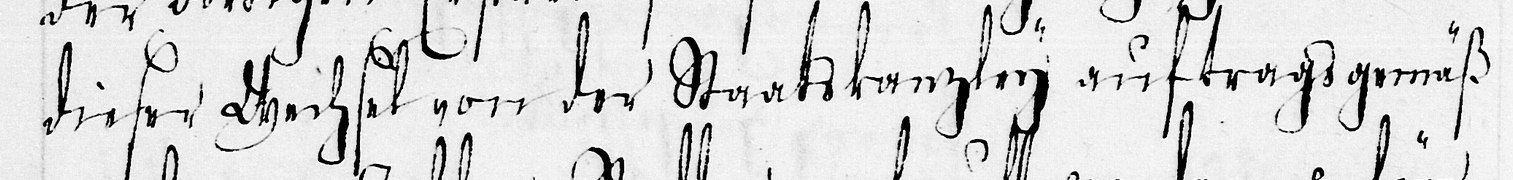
dieser Wechsel von der Staatskanzley auftragsgemäß
